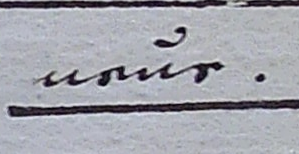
neue.
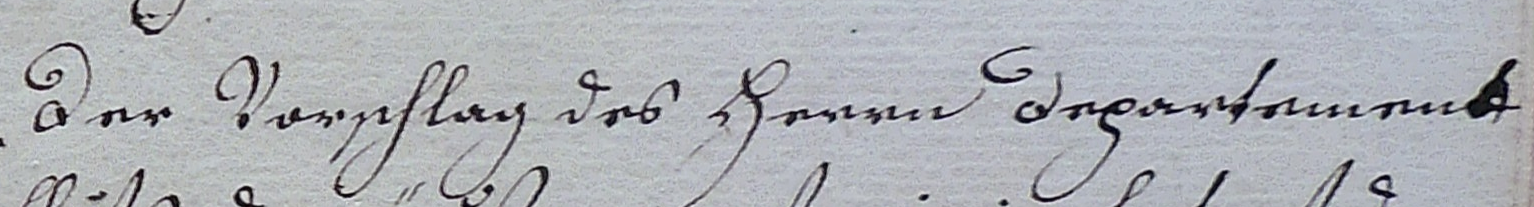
Der Vorschlag des Herrn Departement
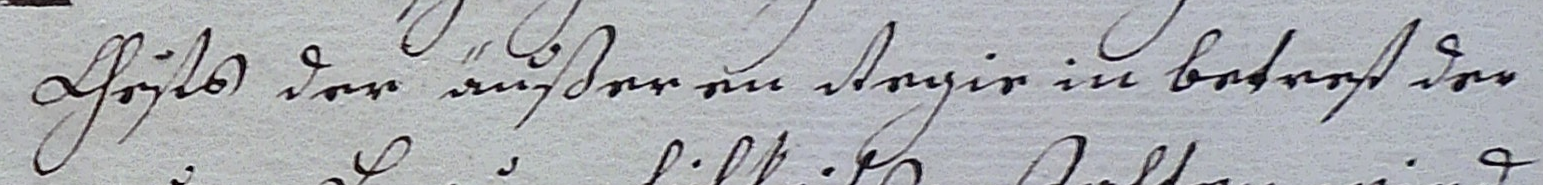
Chefs der äußeren Regie in betref der
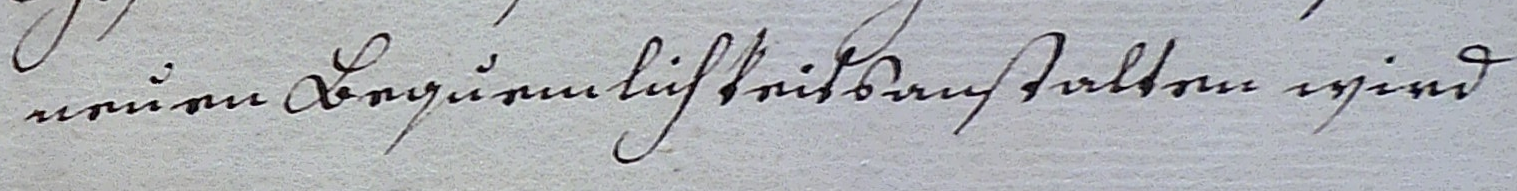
neuen Bequemlichkeitanstalten wird
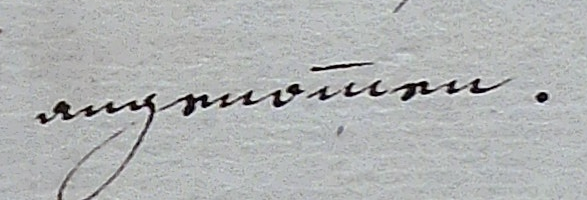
angenom̅en.
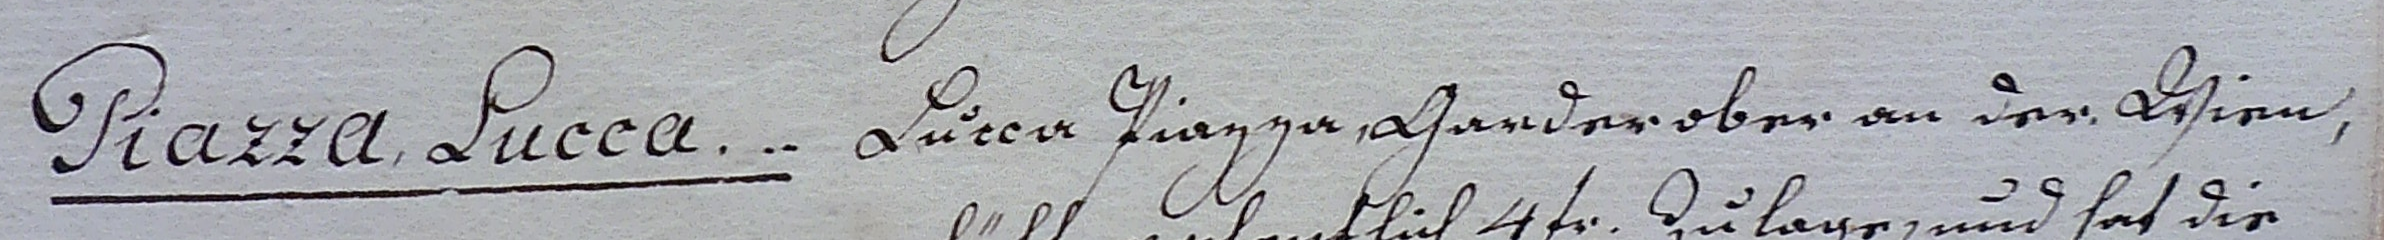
Piazza, Lucca. .. Lucca Piazza Garderober an der Wien,
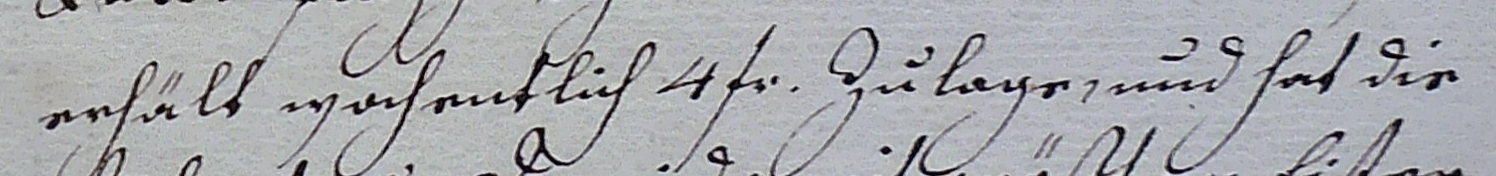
erhält wochentlich 4fr. Zulage, und hat die
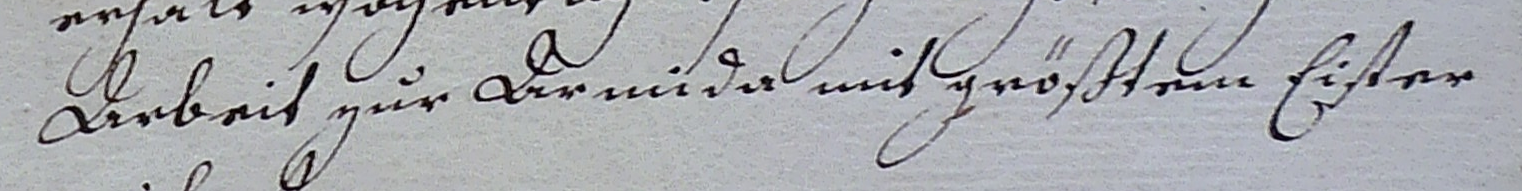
Arbeit zur Armida mit größtem Eifer
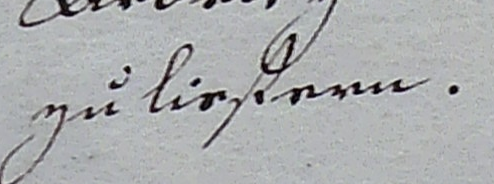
zu liefern.
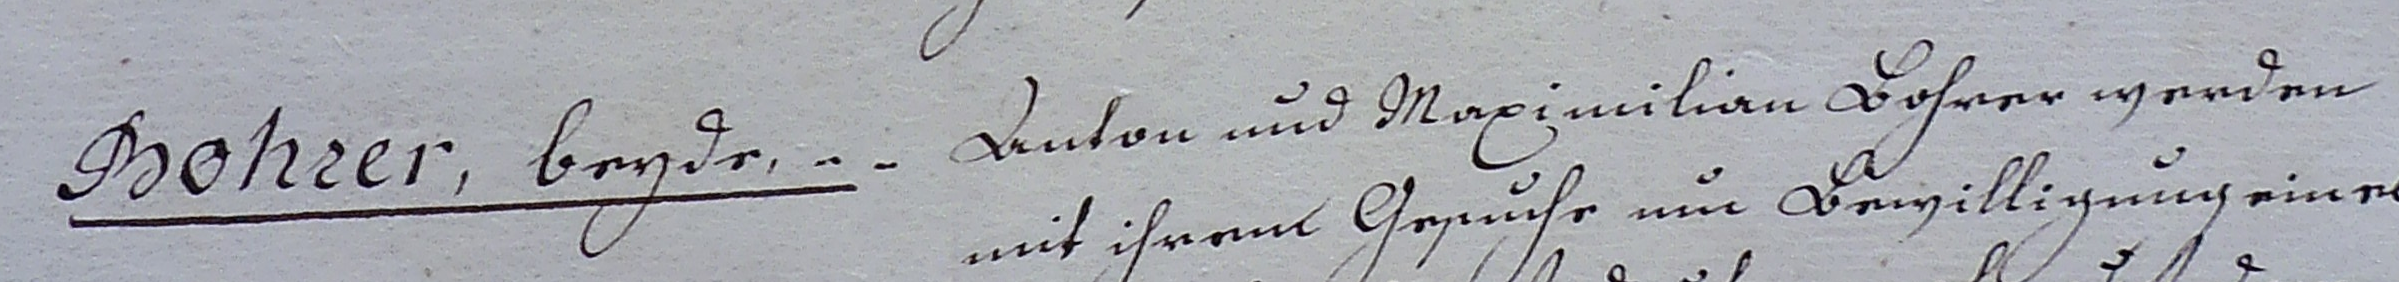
Bohrer, beyde, .. .. Anton und Maximilian Bohrer werden
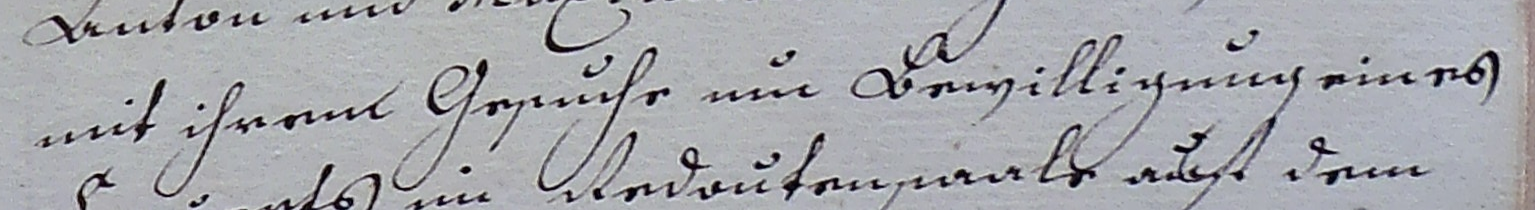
mit ihrem Gesuche um Bewilligung eines
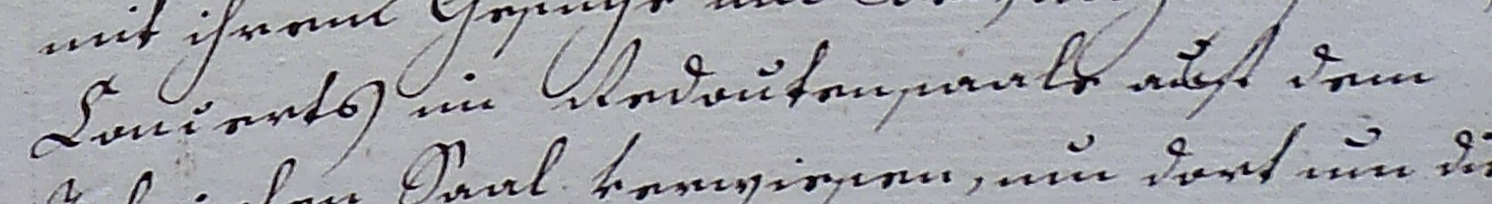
Concerts im Redoutensaale auf dem
